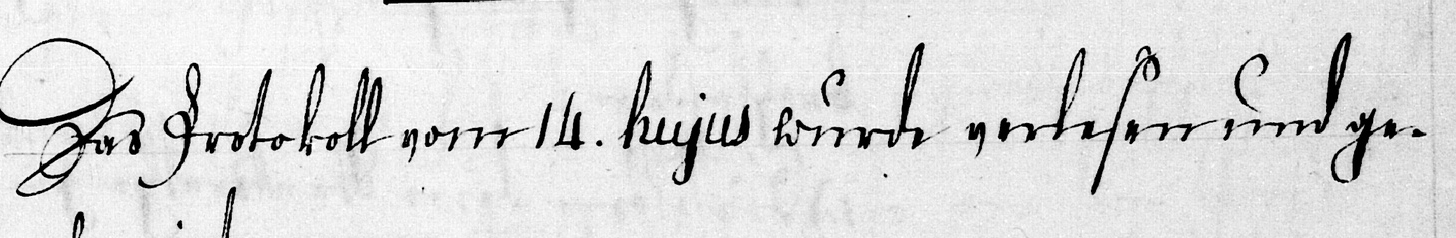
Das Protokoll vom 14. hujus wurde verlesen und ge¬
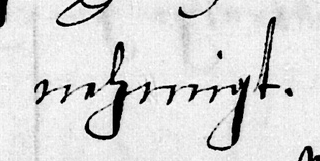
nehmigt.
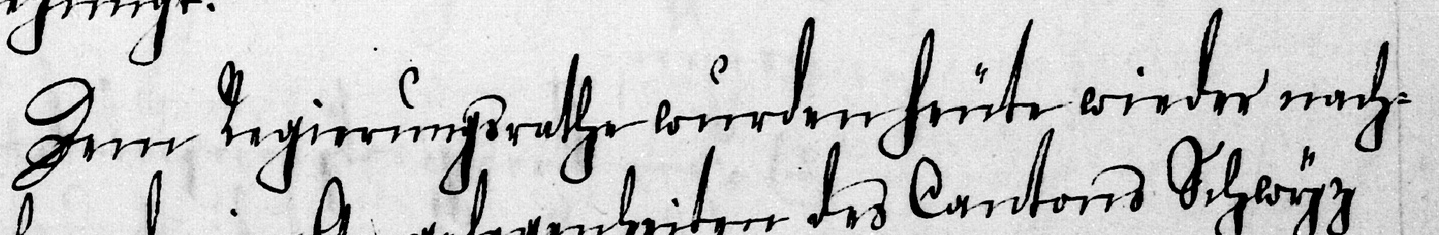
Dem Regierungsrathe wurden heute wieder nach¬
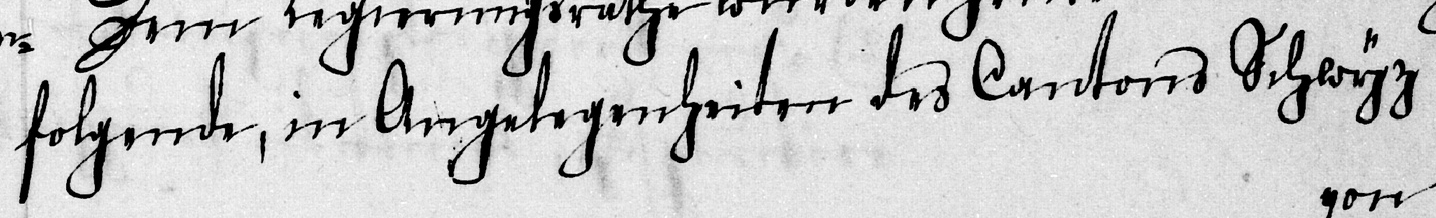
folgende, in Angelegenheiten des Cantons Schwyz
